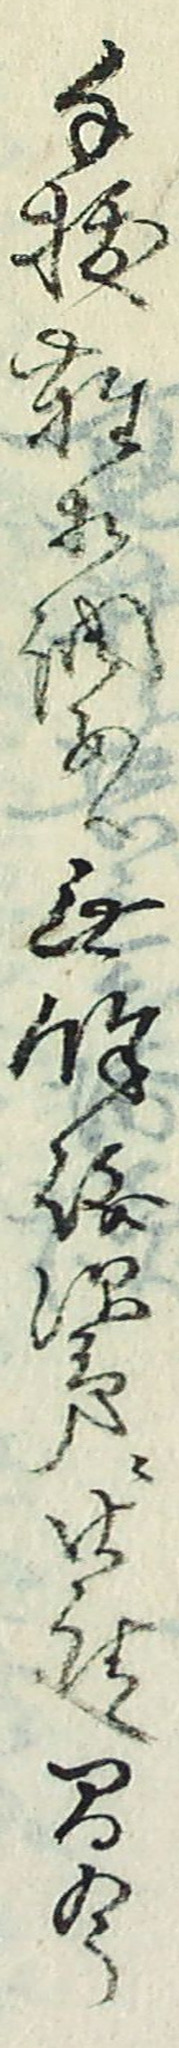手抜難相調義ハ無餘儀次第ニ御座候間今
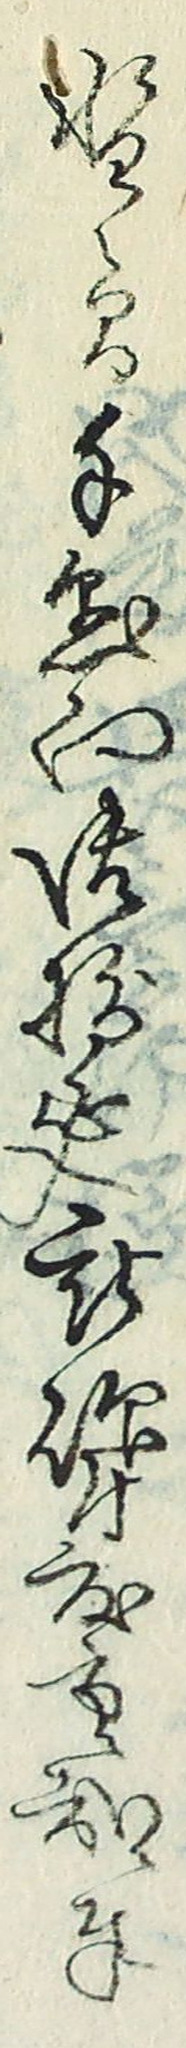暫之間手懸向御指延被仰付度方ニ哉ニ奉
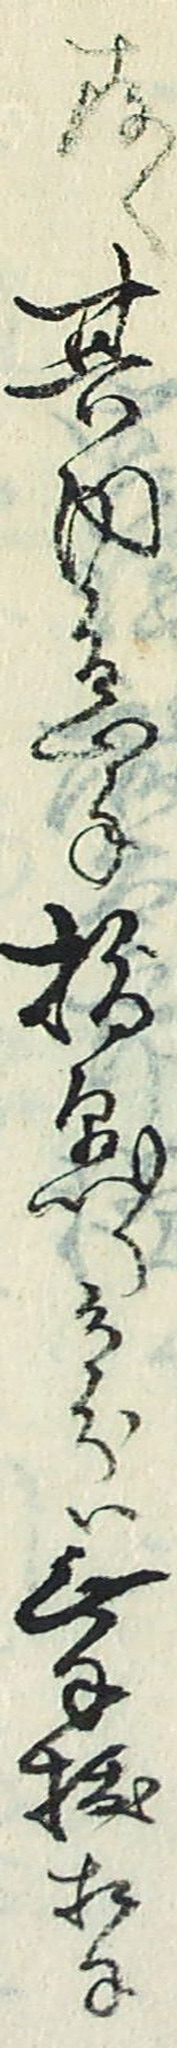存候其内急手指懸り候分ハ無手抜相手
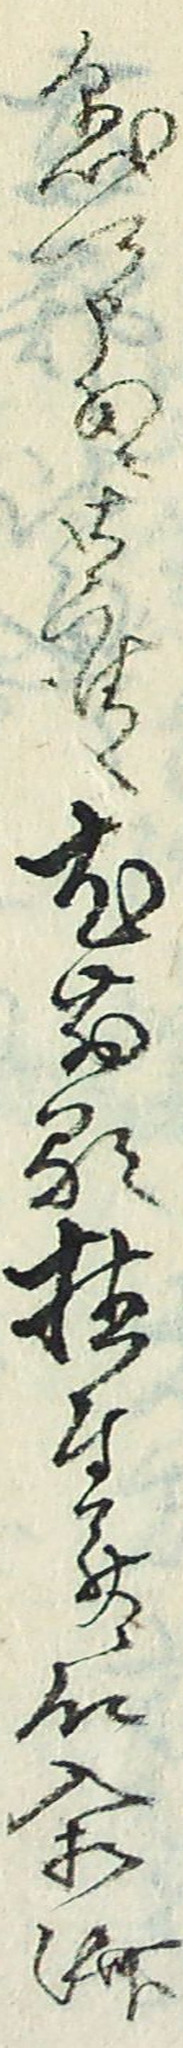懸可申義ニ御座候尤も前顕植付幷ニ取入相済
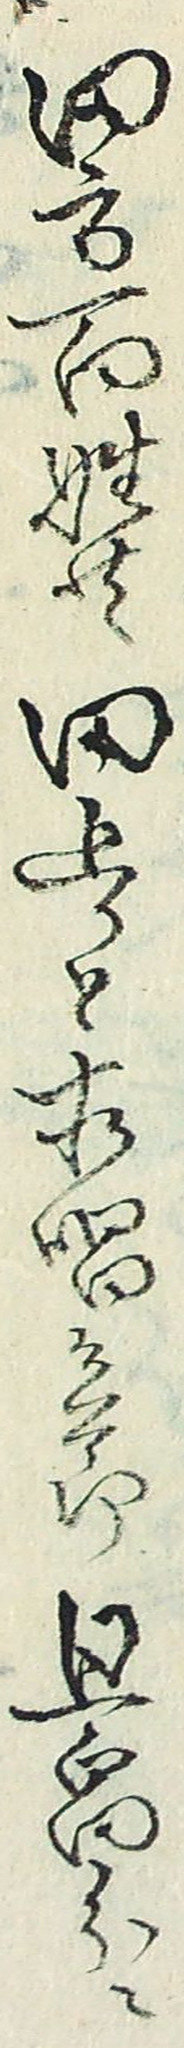田方百姓共田上りと相唱候節且畠分ニ
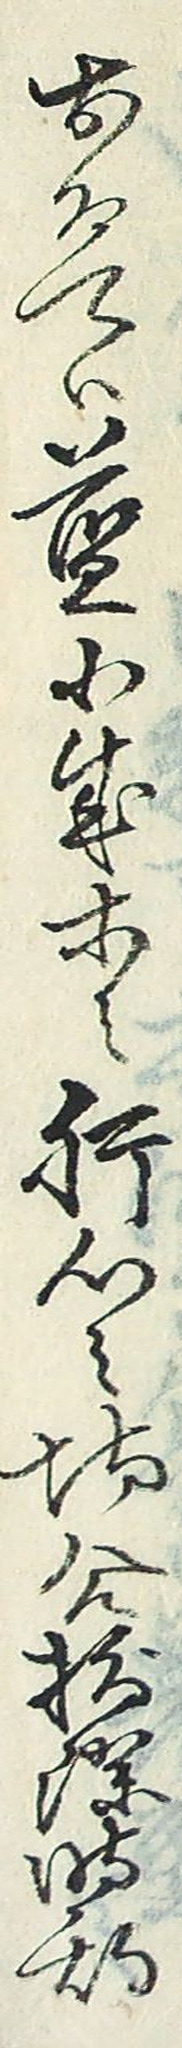おゐてハ藍小成等之肝心之場合指際時期

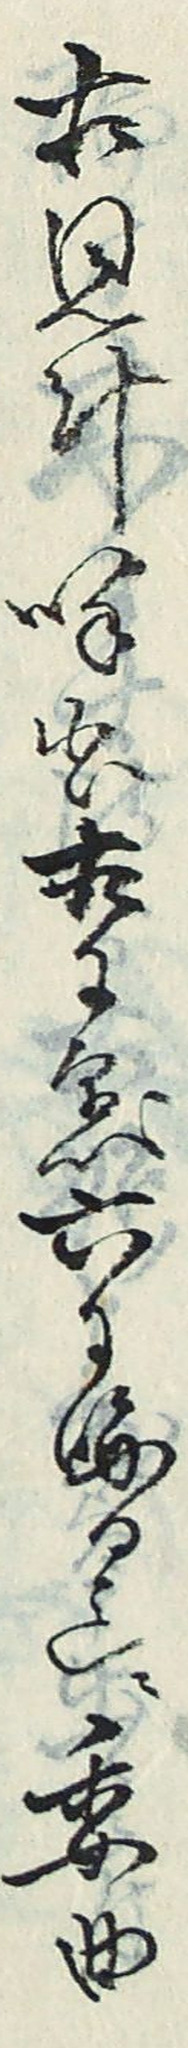相見計呼出相手懸六月晦日迄ニ委曲
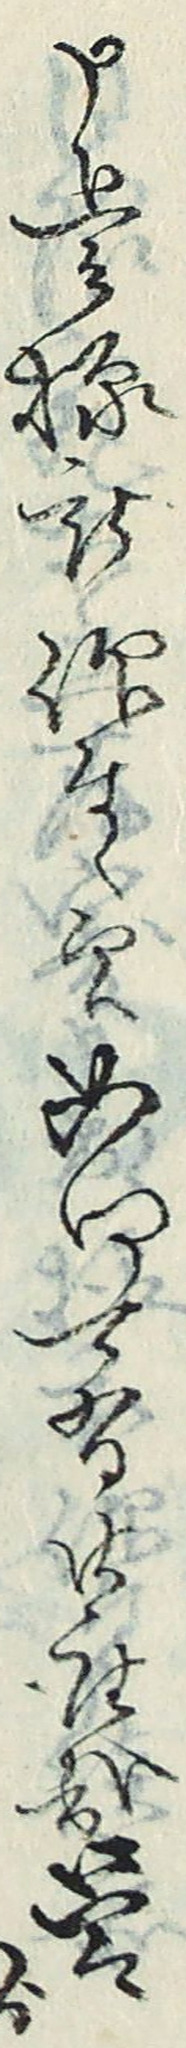申上候様被仰付候而ハ如何可有御座哉只今ゟ
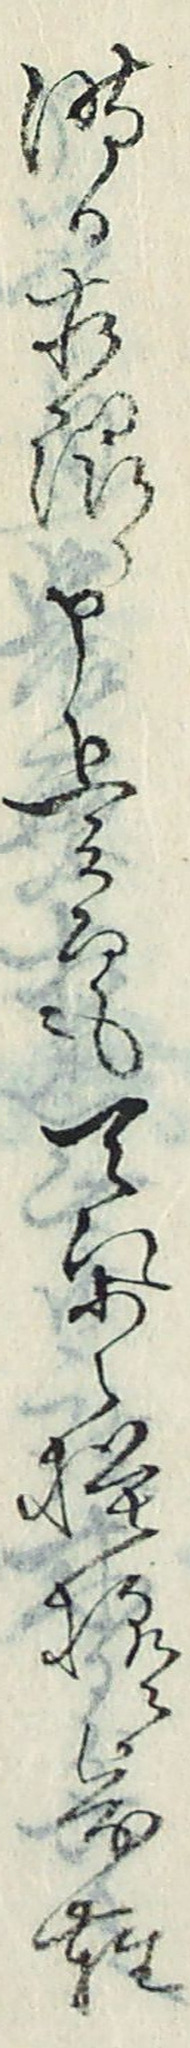時日相限り申上候而も天氣之模様ニ寄難
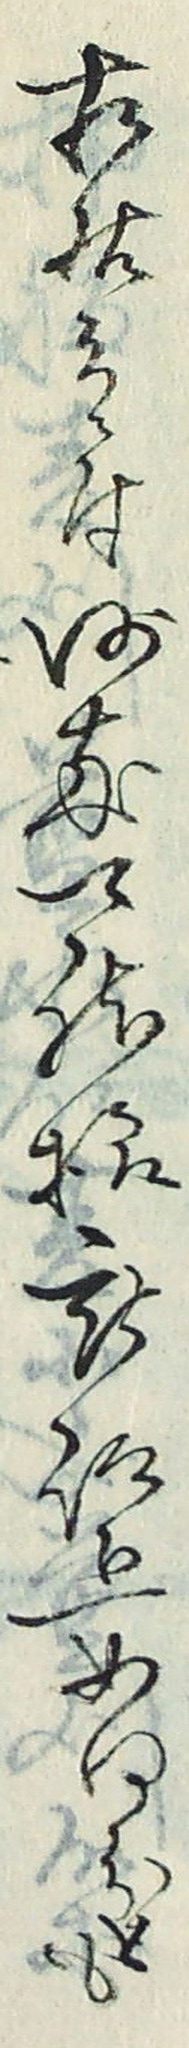相居候ニ付何卒可然様被仰上如何分とも
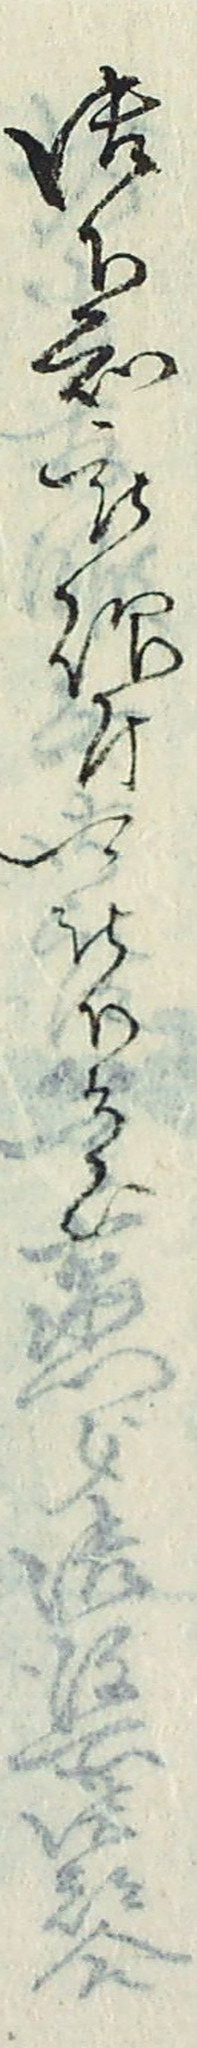御下知被仰付可被下候以上
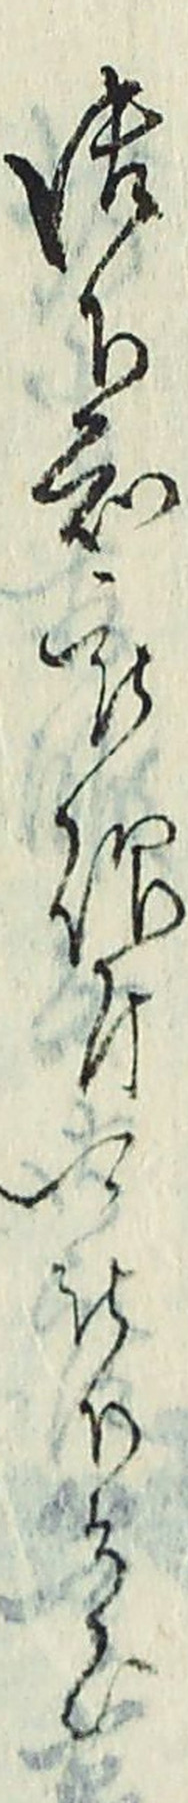御下知被仰付可被下候以上
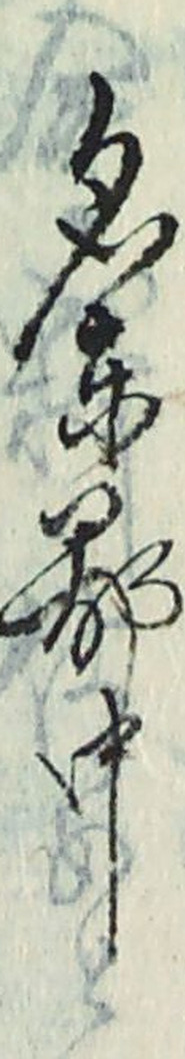名東郡中
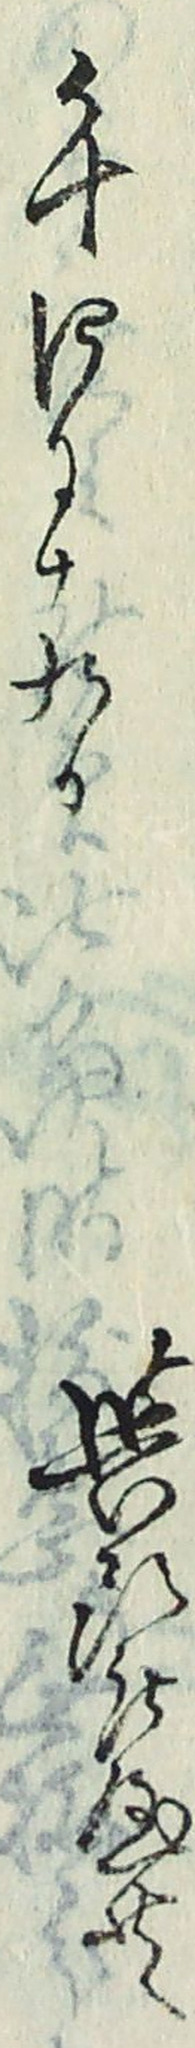午四月十九日與頭庄屋共
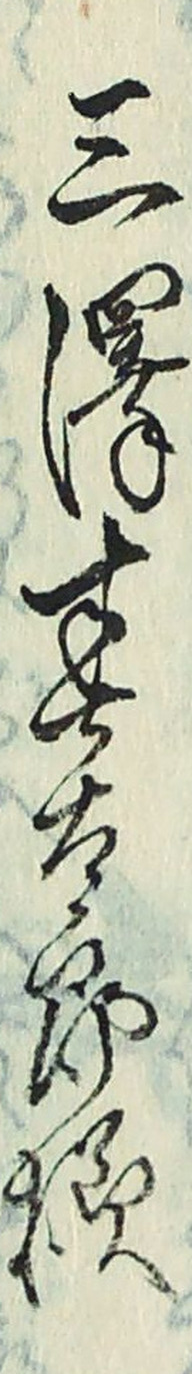三澤春太郎様
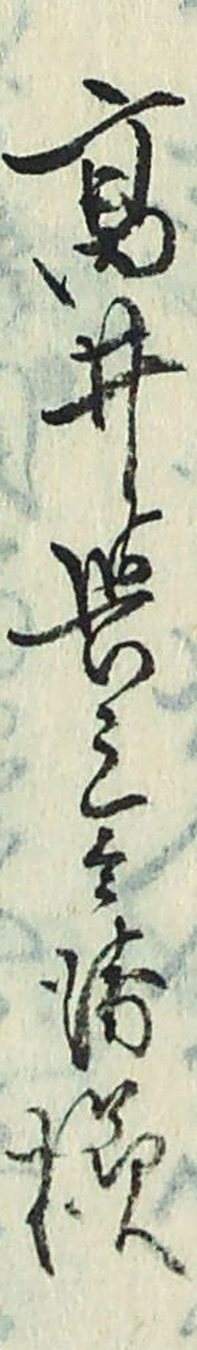高井與三兵衛様
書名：諸御趣意書并御下知向之写
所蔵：鳴門教育大学 Naruto University of Education
